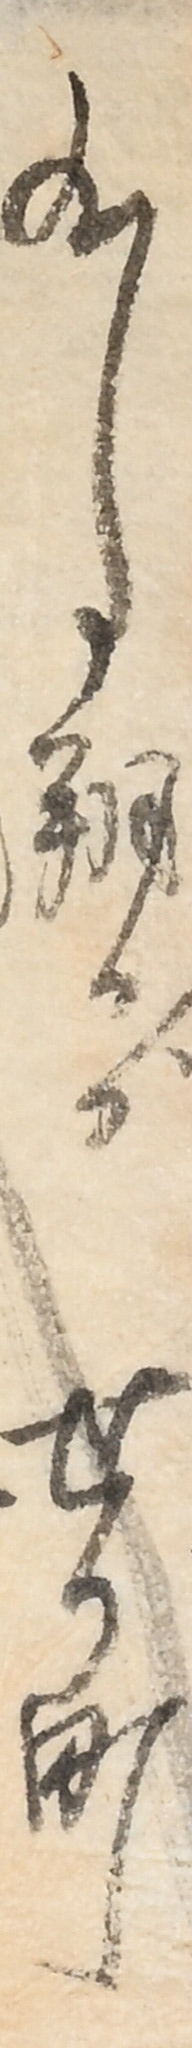九月朔日ゟ
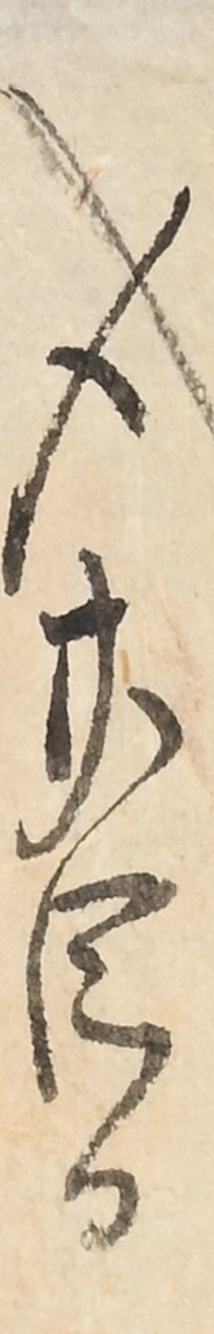〆廿四日
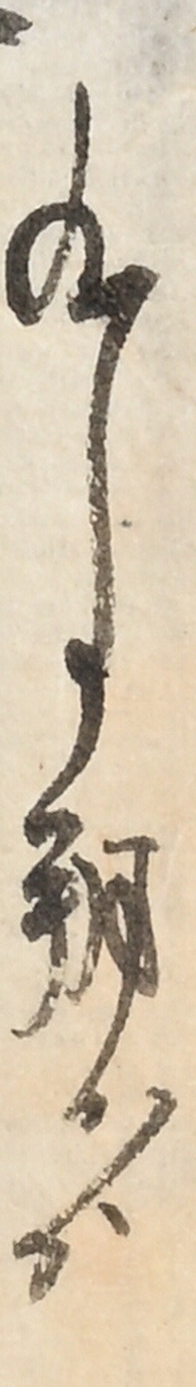九月朔日ゟ
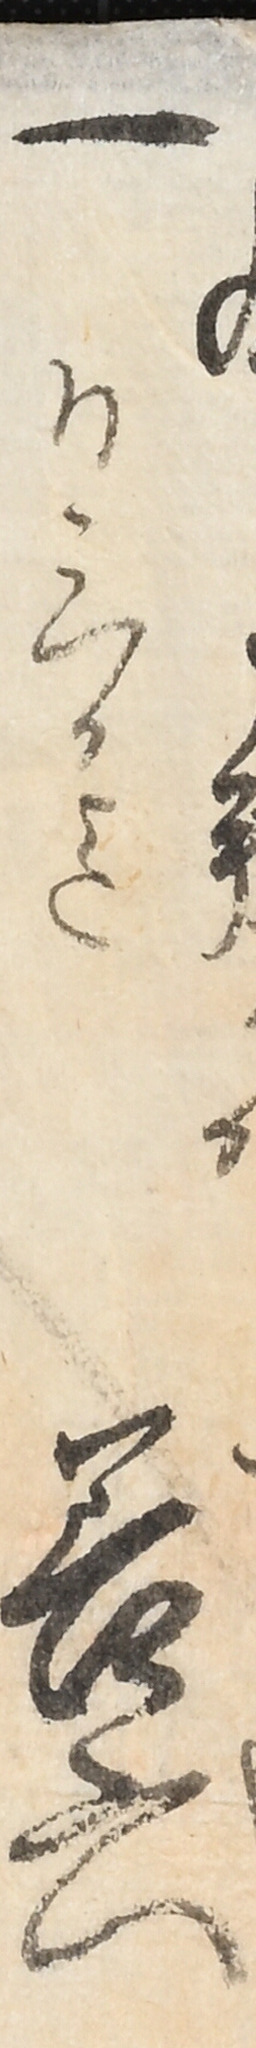一同三日迄善六
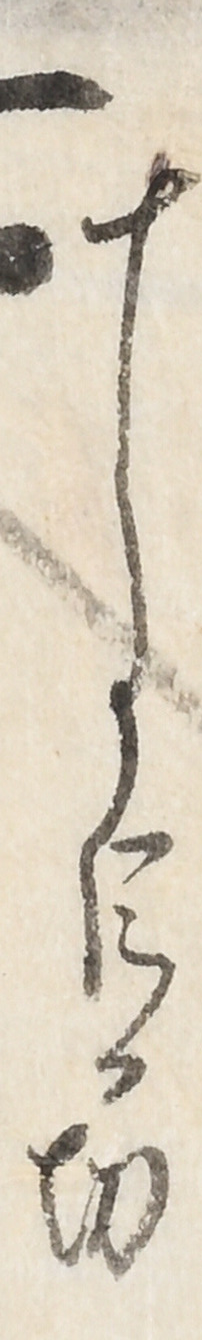十月四日切
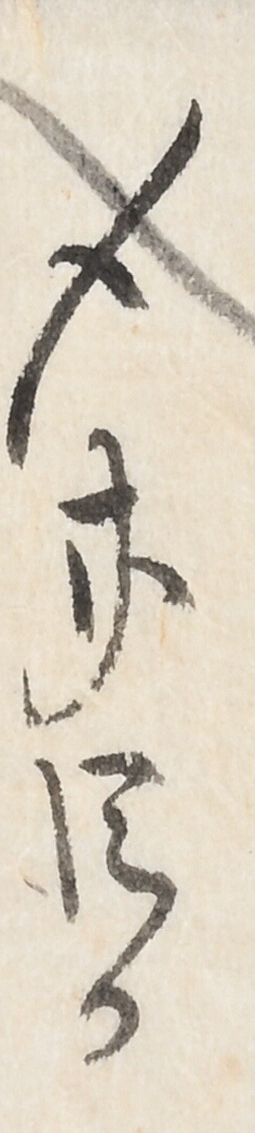〆廿四日
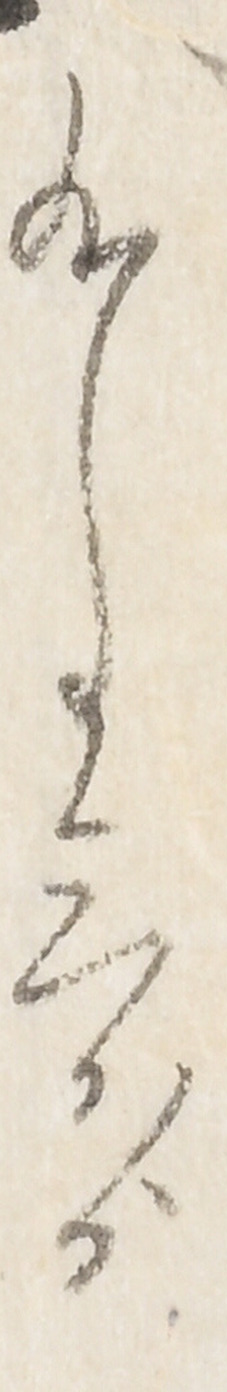九月朔日ゟ
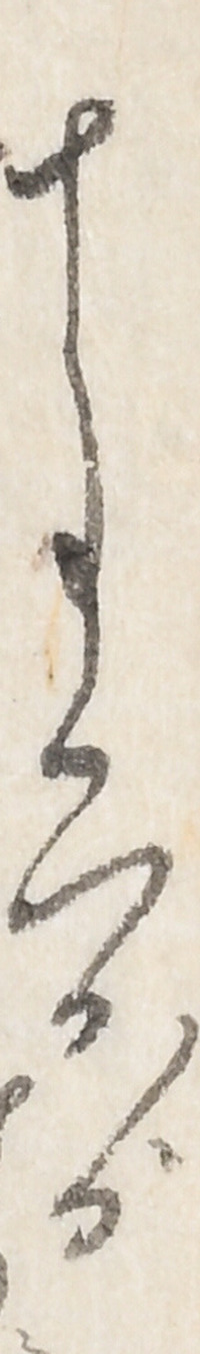十月二日ゟ
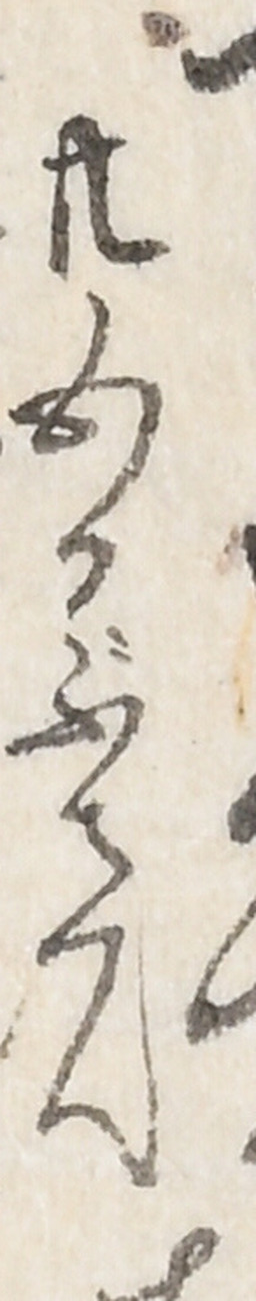一廿五日ぶさん
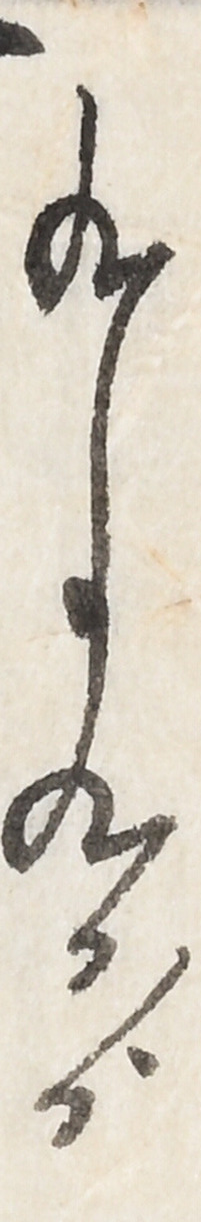九月九日ゟ
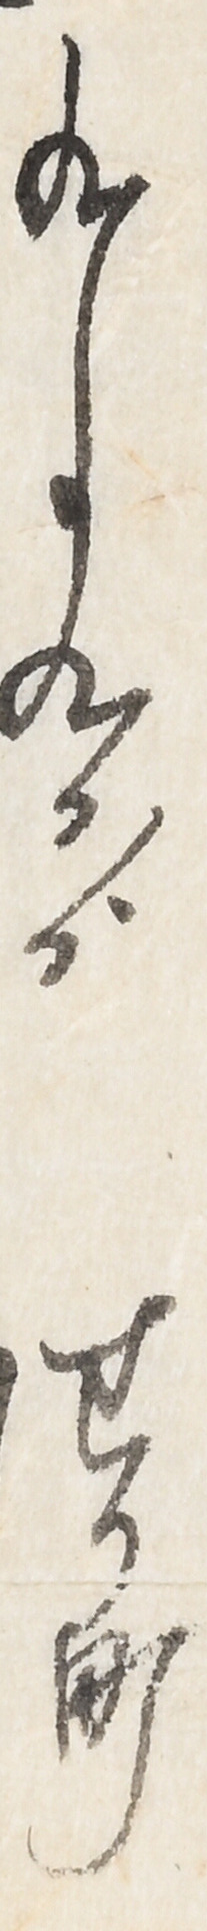九月九日ゟ
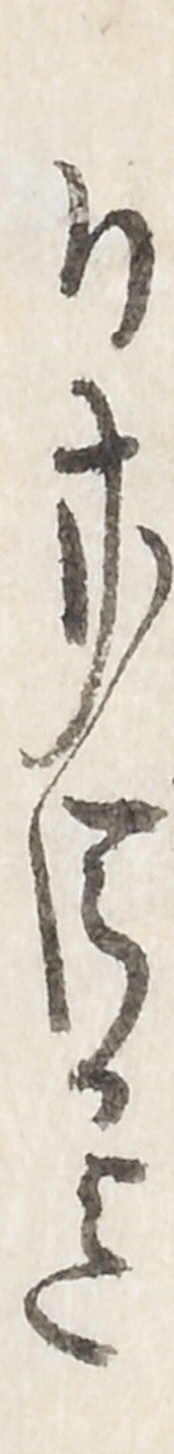同廿四日迄
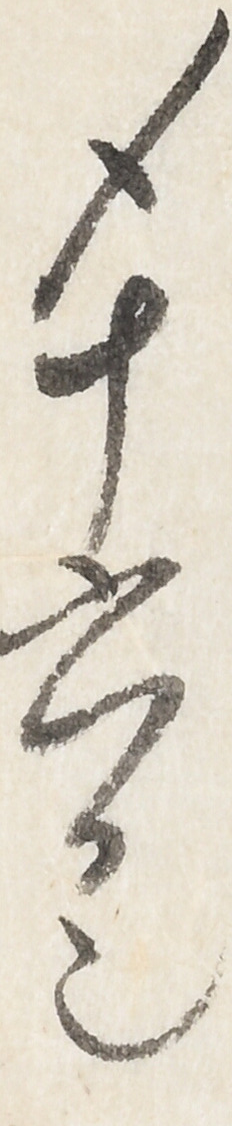〆十六日也
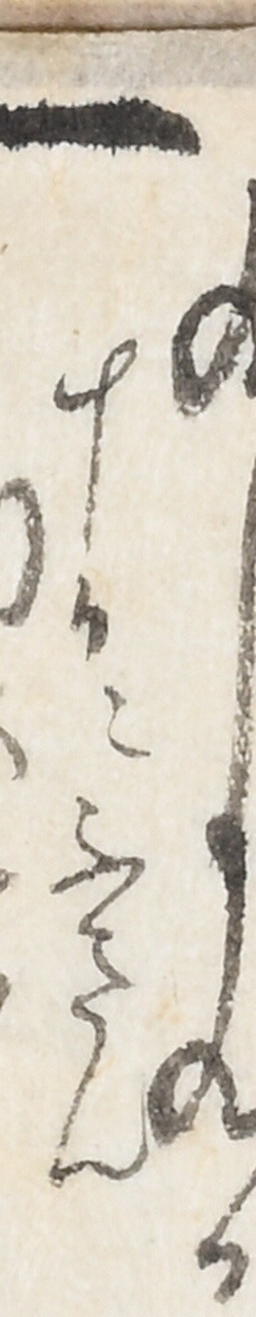一十日ニふさん
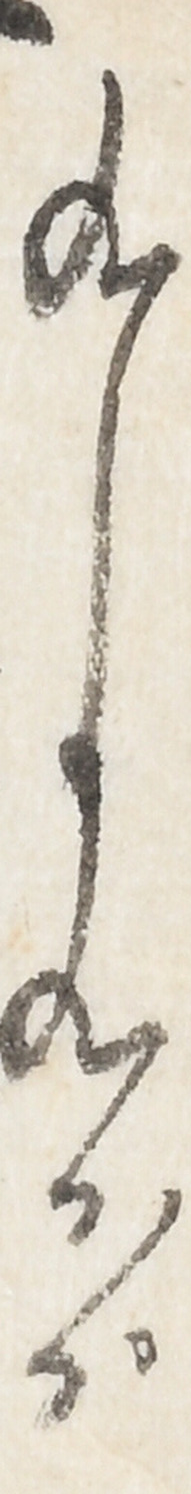九月九日ゟ
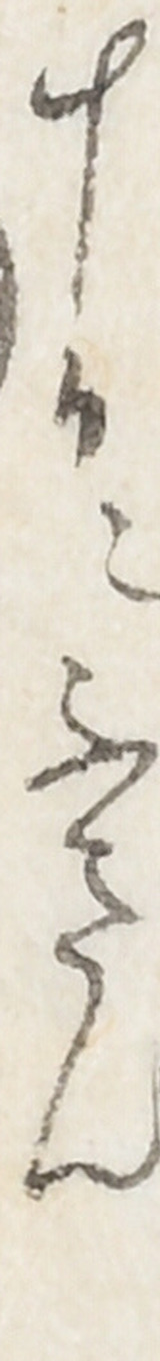一十日ニふさん
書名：合力覚帳
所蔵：伊那市立高遠町図書館・合同会社AMANE
